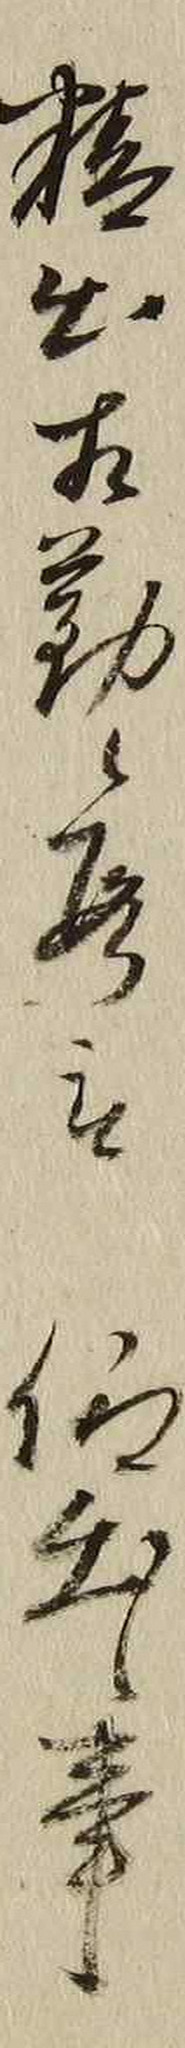精出相勤候段被仰出候事
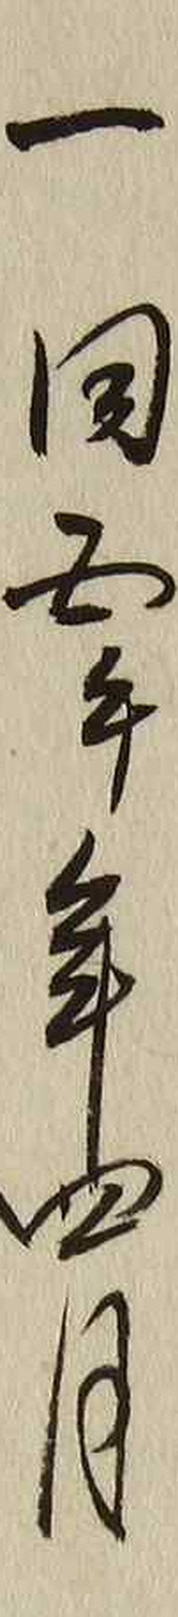一同五午年四月
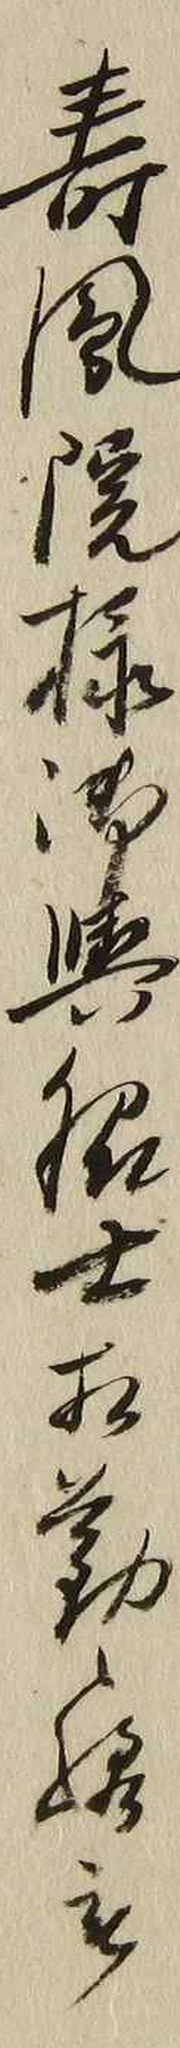寿鳳院様御輿脇士相勤候様被
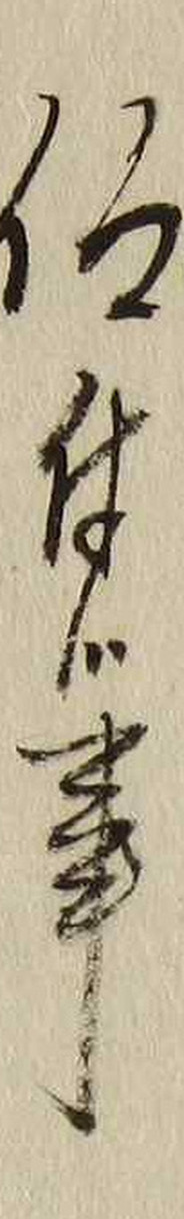仰付候事
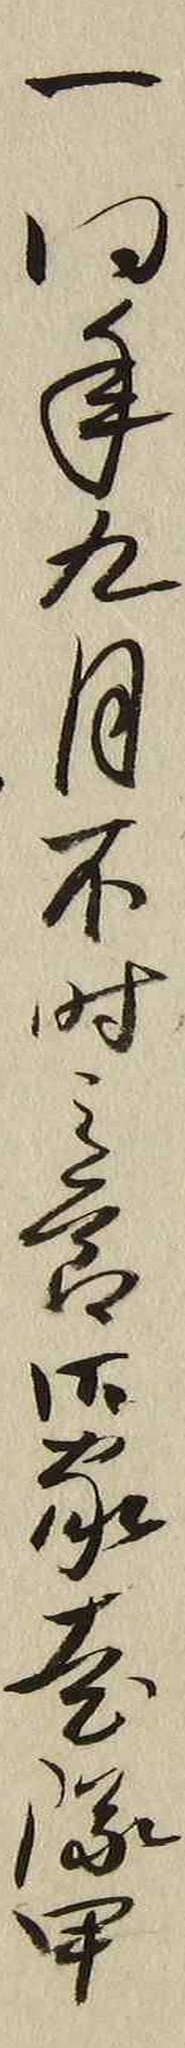一同年九月不時之節御家老隊甲
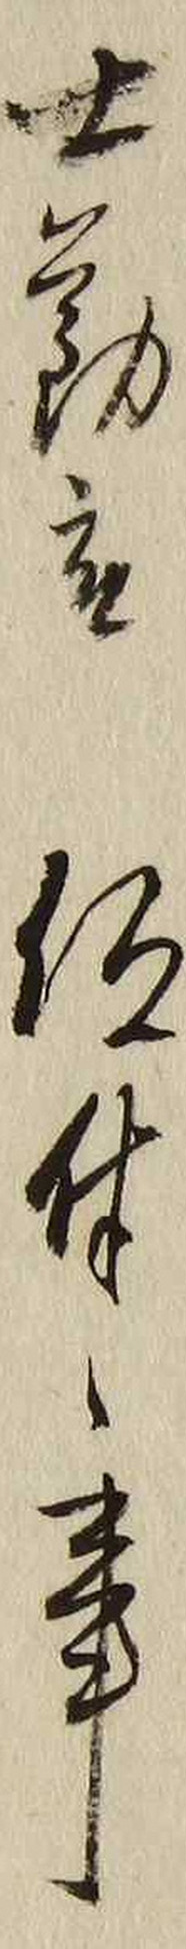士勤被仰付候事
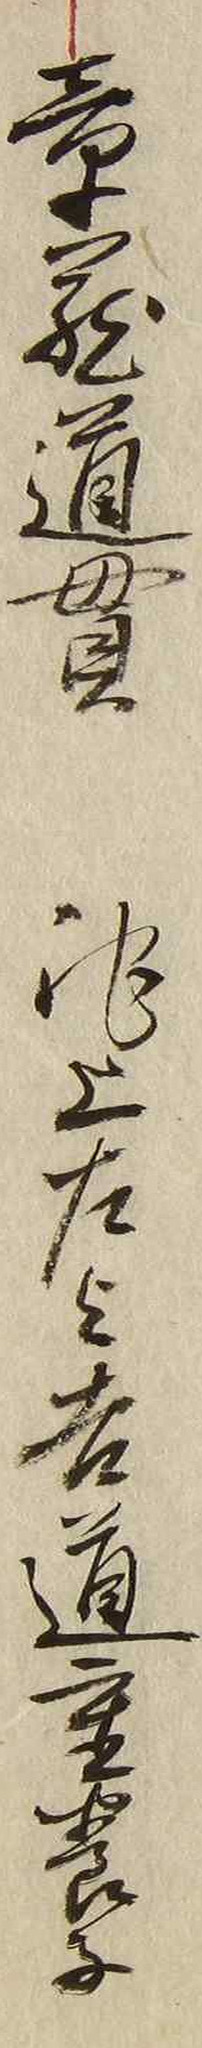章蔵道貫池上左与吉道重養子

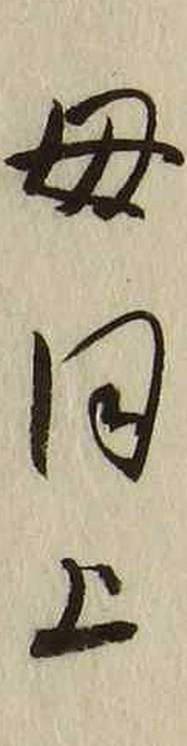母同上
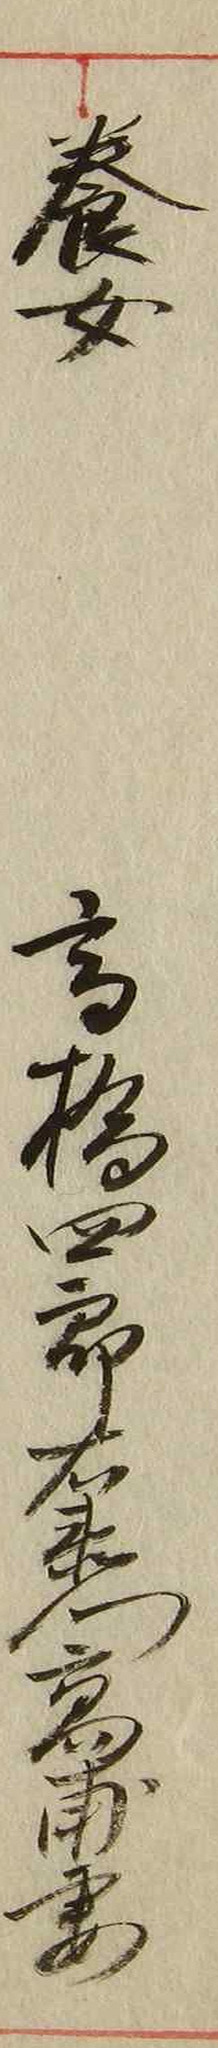養女高橋四郎右衛門高甫妻
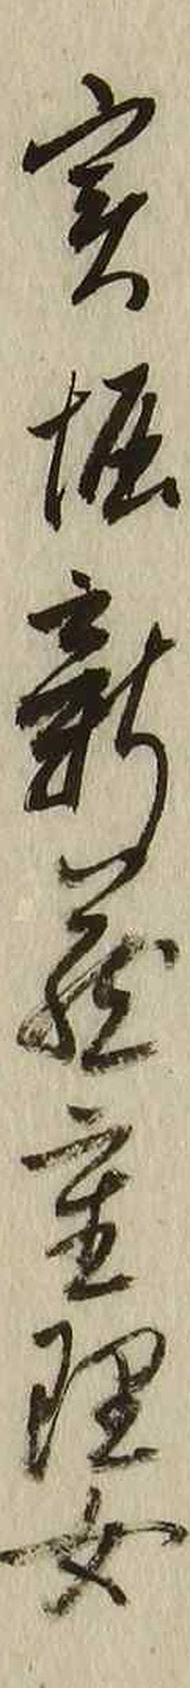実堀新蔵重理女
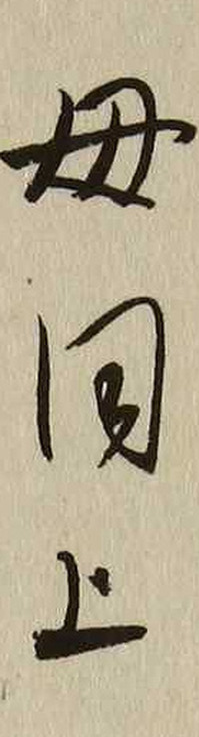母同上
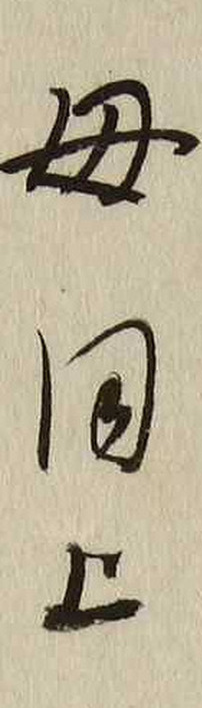母同上
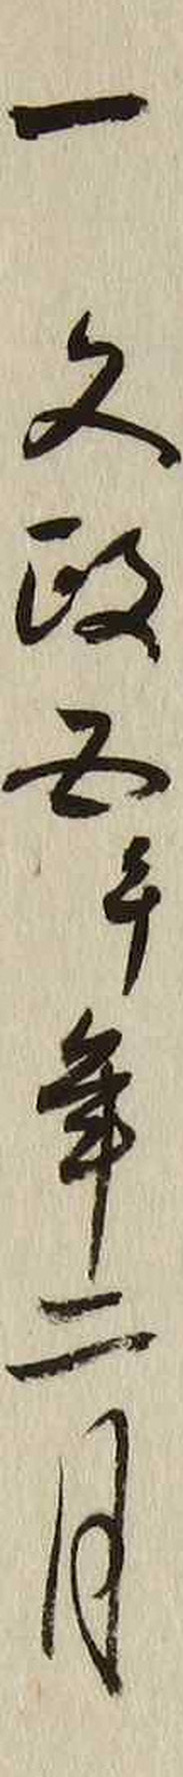一文政五午年二月
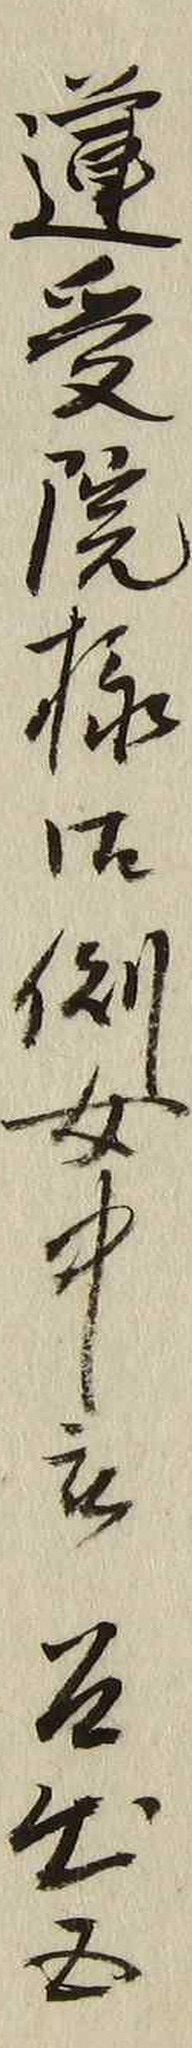蓮受院様御側女中被召出五
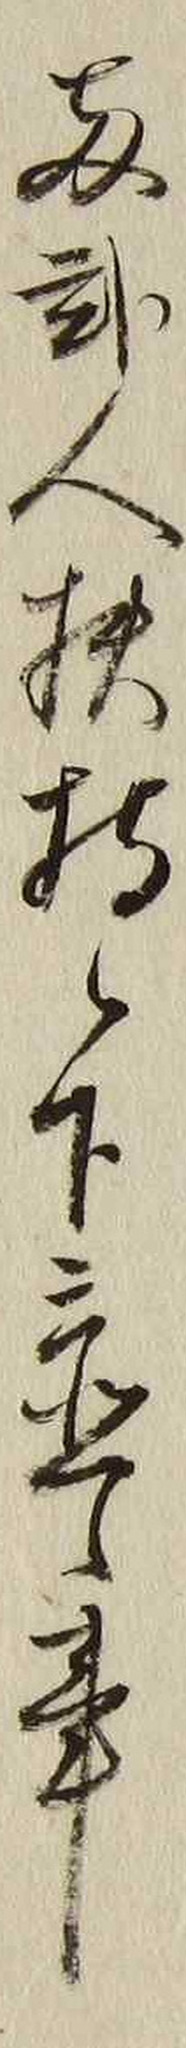両弐人扶持被下置候事

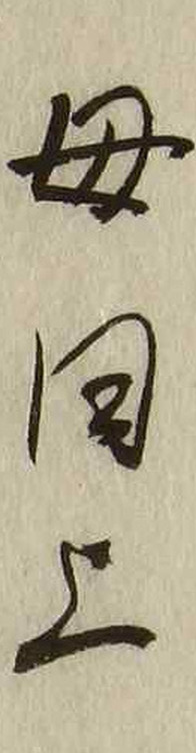母同上
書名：諸士系譜　巻之352　す之部2
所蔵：会津若松市立会津図書館
